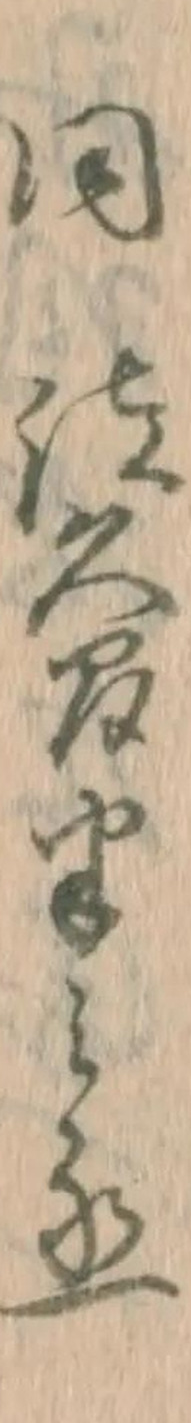∵同佐久間半之丞
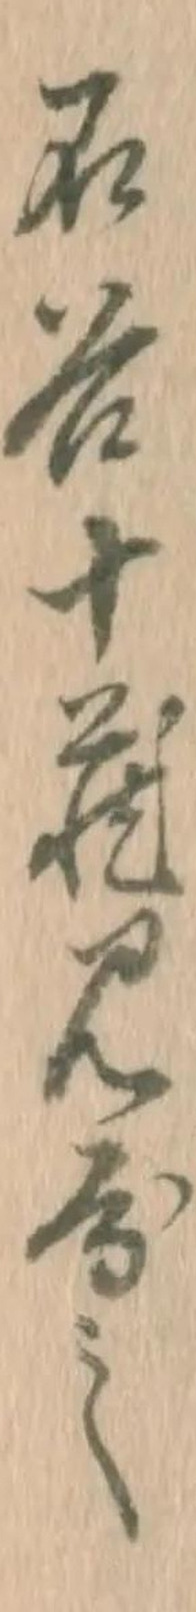石谷十蔵見分之
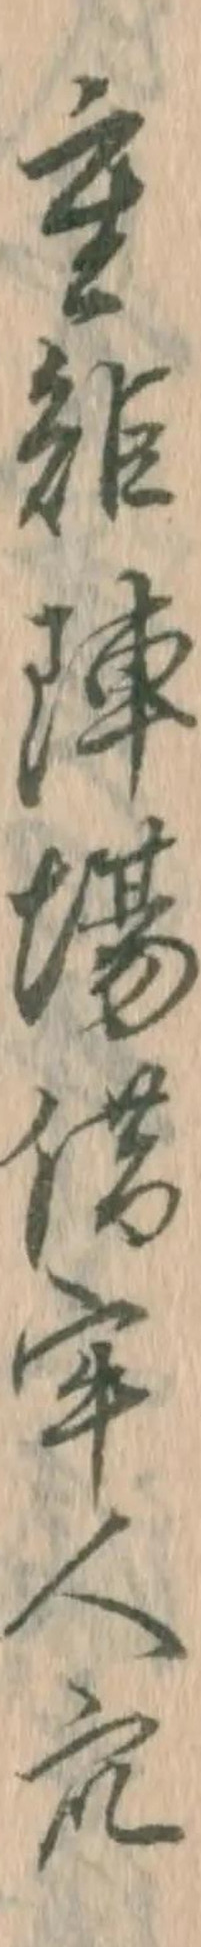重矩陣場借牢人衆
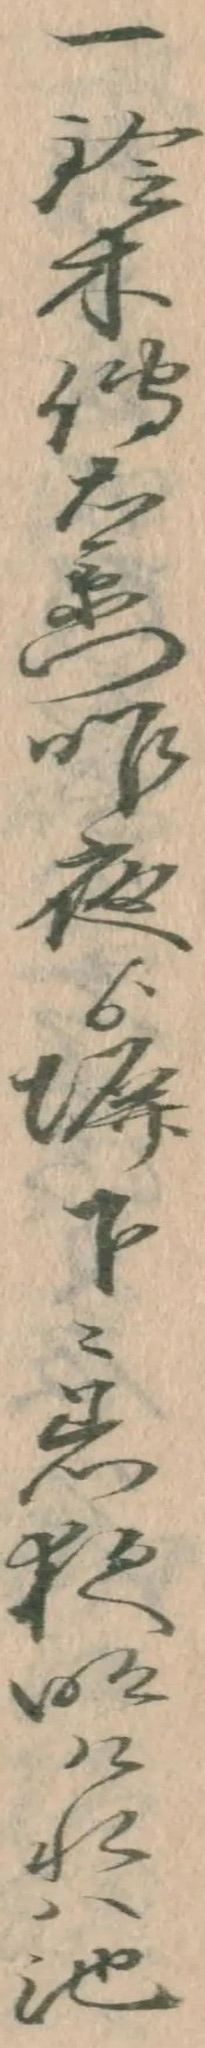一鈴木伝右衛門昨夜ゟ塀下に着夜明けれは池
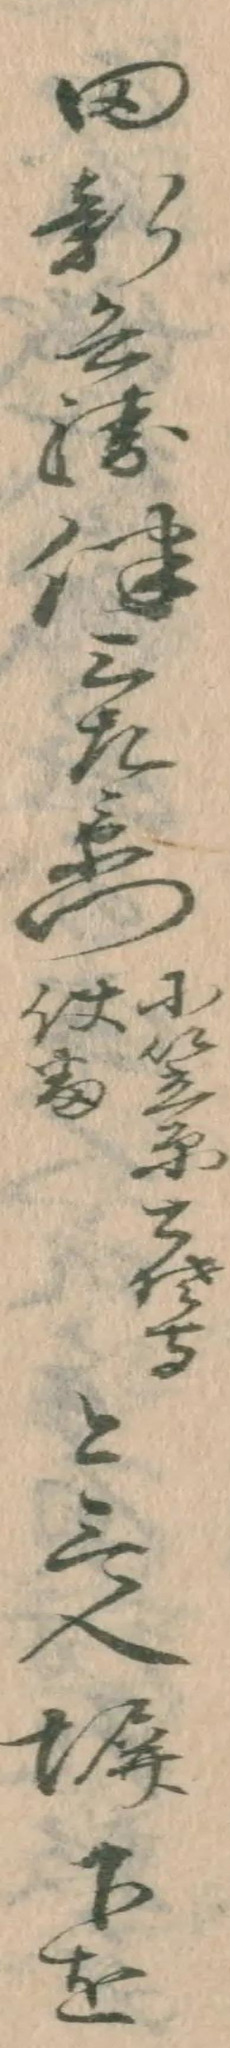田新兵衛伴三左衛門小笠原土佐守使番と三人塀下を
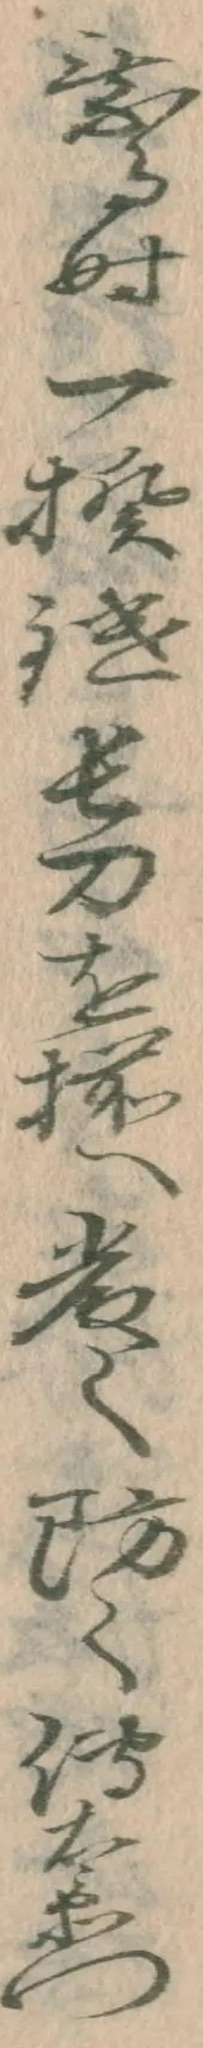乗る時一揆鑓長刀を揃へ厳く防く伝右衛門
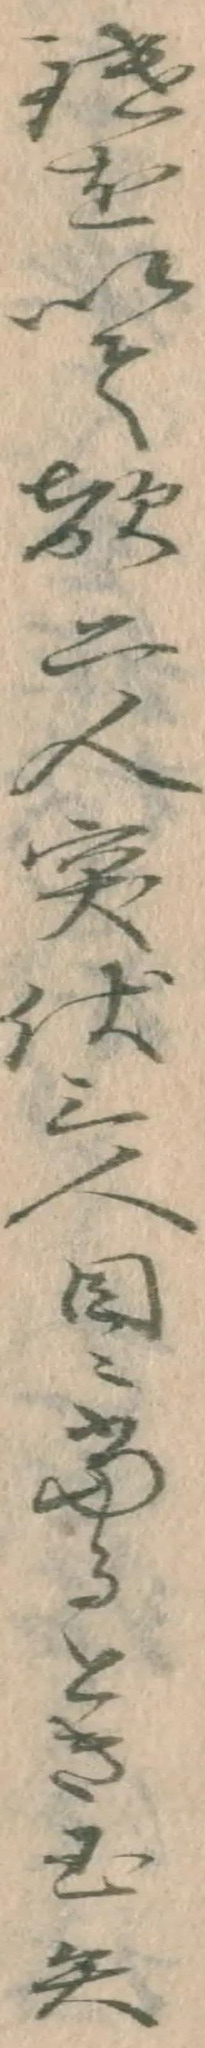鑓を以て敵二人突伏三人目に当るとき玉矢
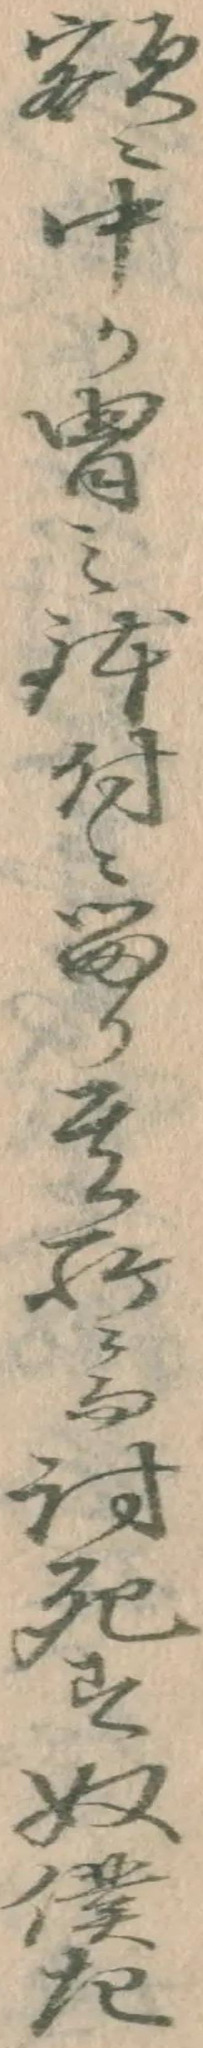額に中り冑之躰付に留り其所に而討死春奴僕左
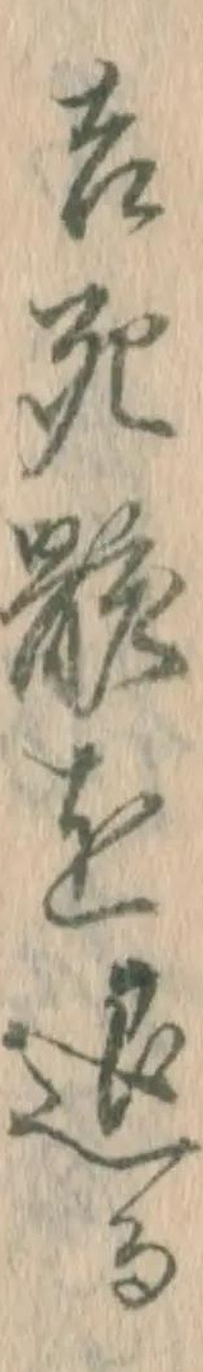吉死骸を退る
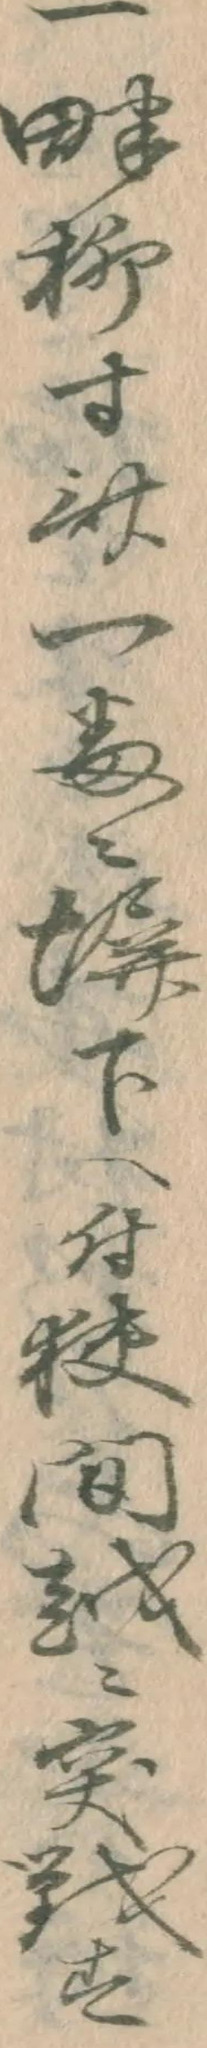一畔柳寸斎一番に塀下へ付狭間越に突戦春
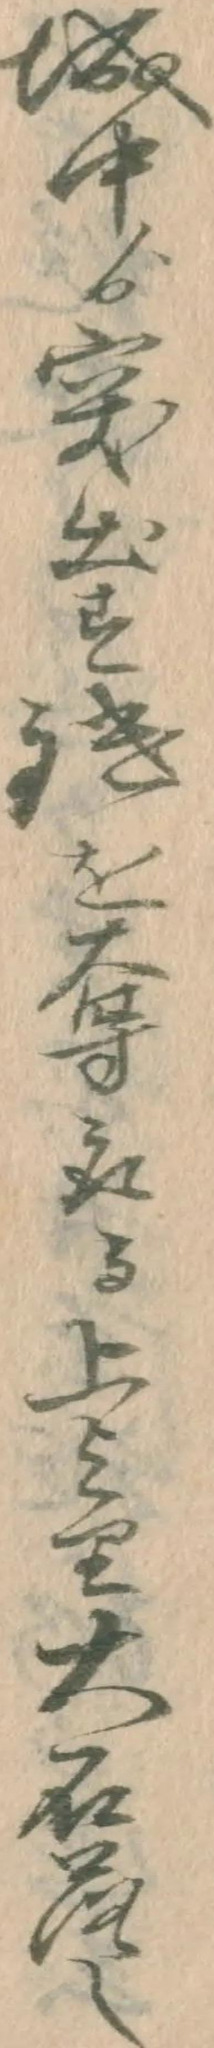城中ゟ突出春鑓を奪取る上与里大石落し

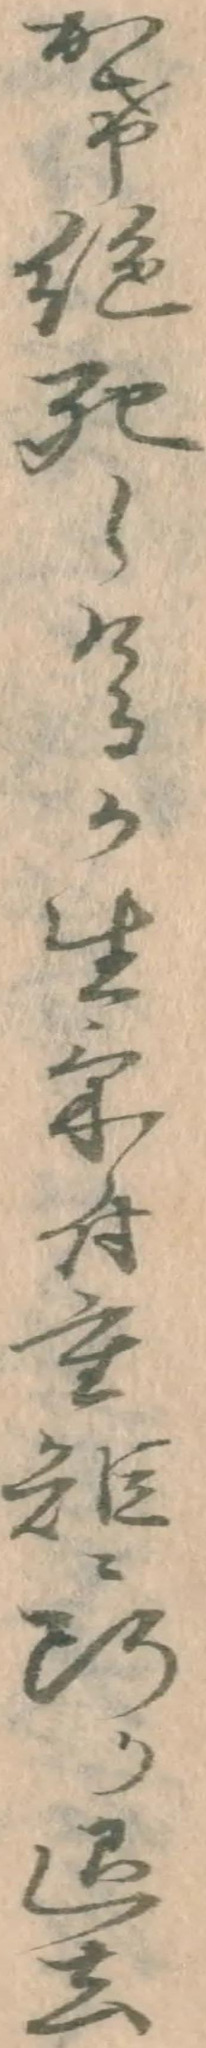加希絶死しけるか生気付重矩に断り退去
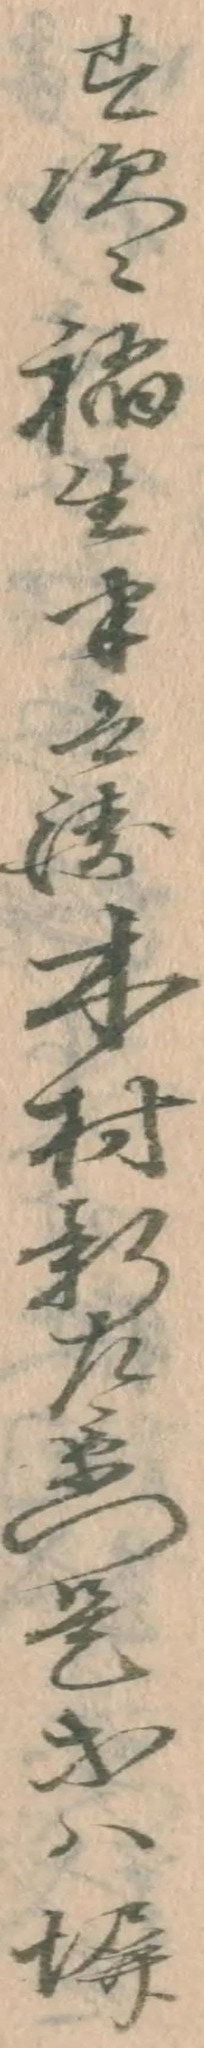春次に福生半兵衛木村新左衛門是等は塀
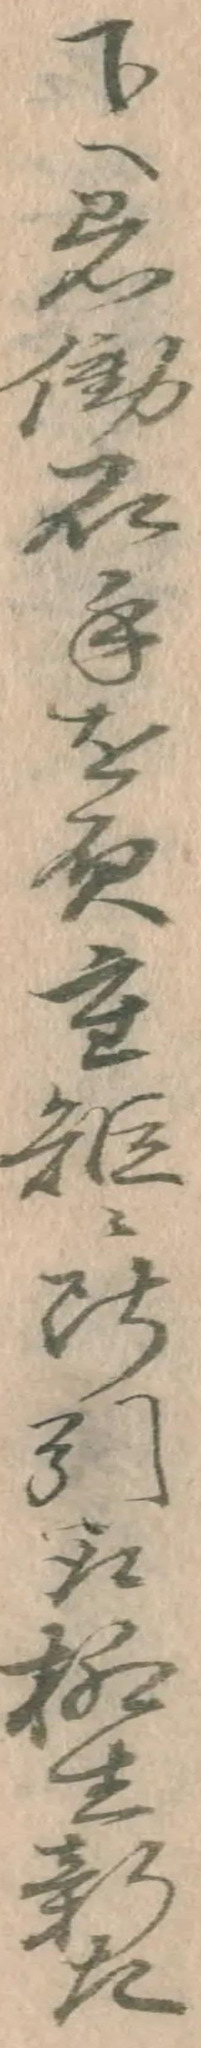下へ着働石手を負重矩に断引取柳生新左
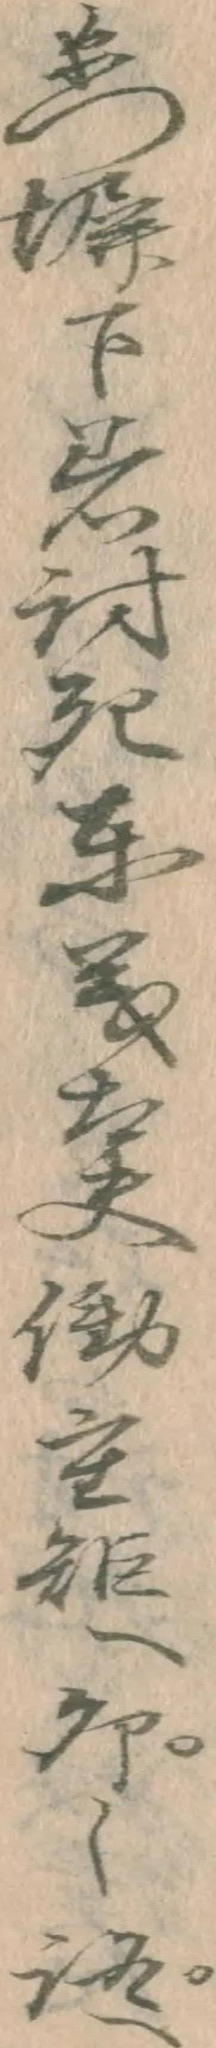衛門塀下着討死東義太夫働重矩へ夘し語
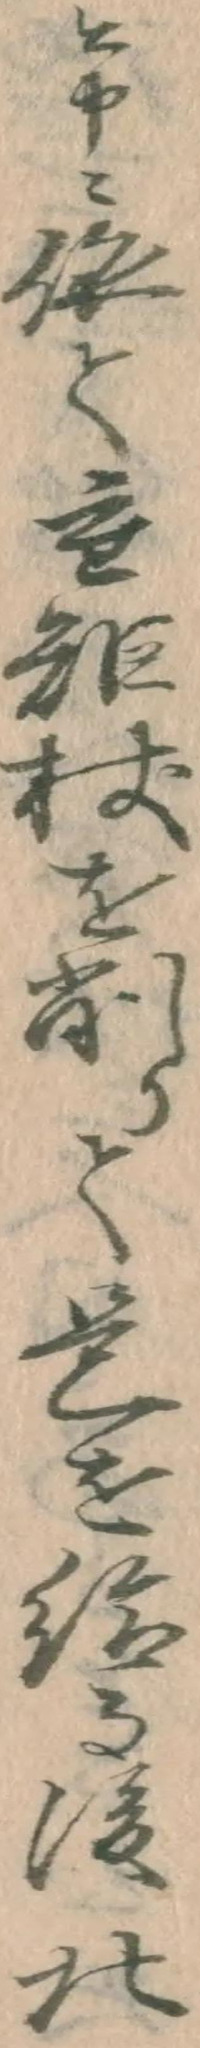と申に依て重矩枝を削りて是を給る後北
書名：切支丹御退治記 49巻. [8]
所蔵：国立国会図書館 National Diet Library, JAPAN
